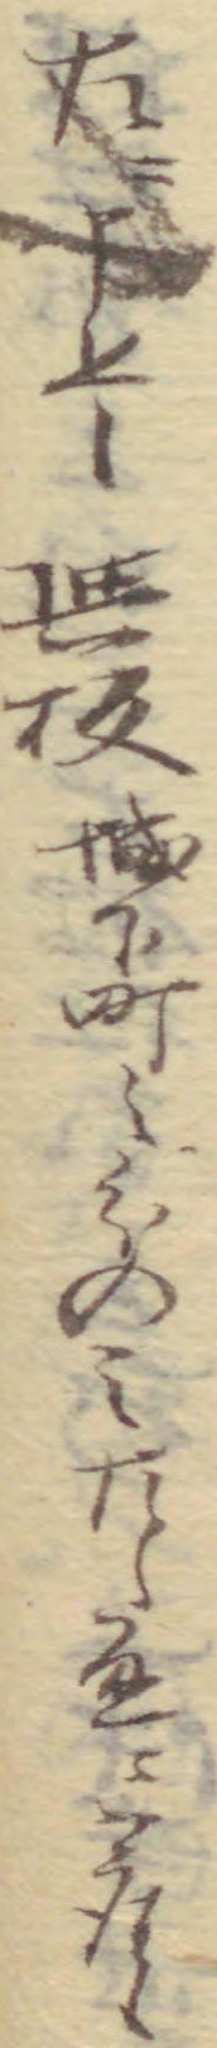左ニ申上候与板城下町之分のミ左之通ニ御座候
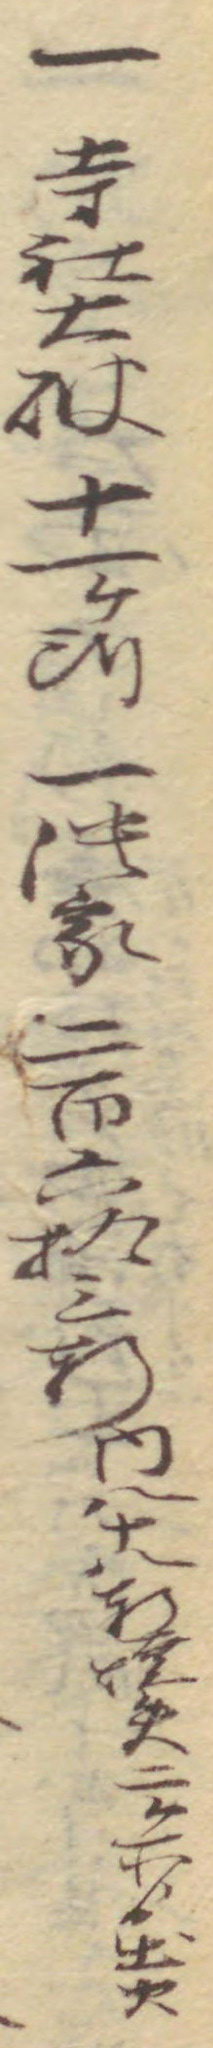一寺社大破十一ケ所一潰家二百六拾三軒内八十八軒焼失二ケ所ゟ出火
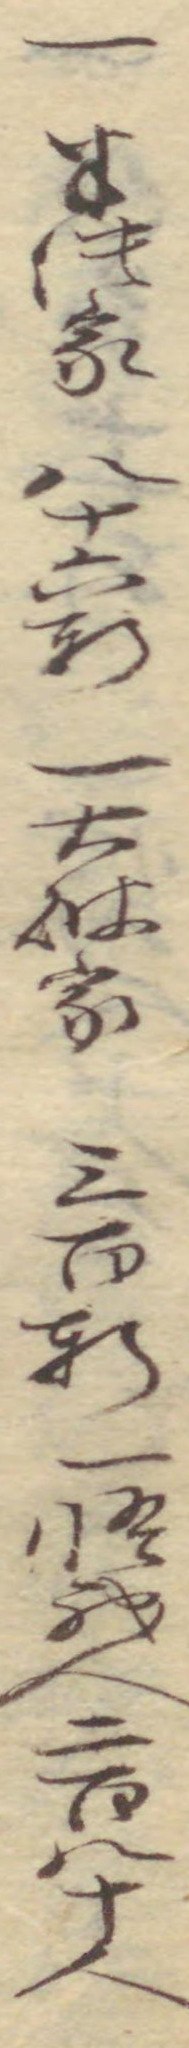一半潰家八十六軒一大破家三百軒一怪我人二百八十人
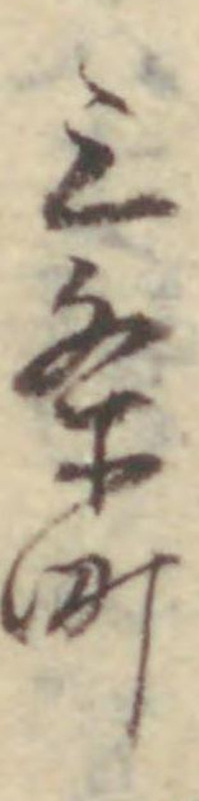三条町

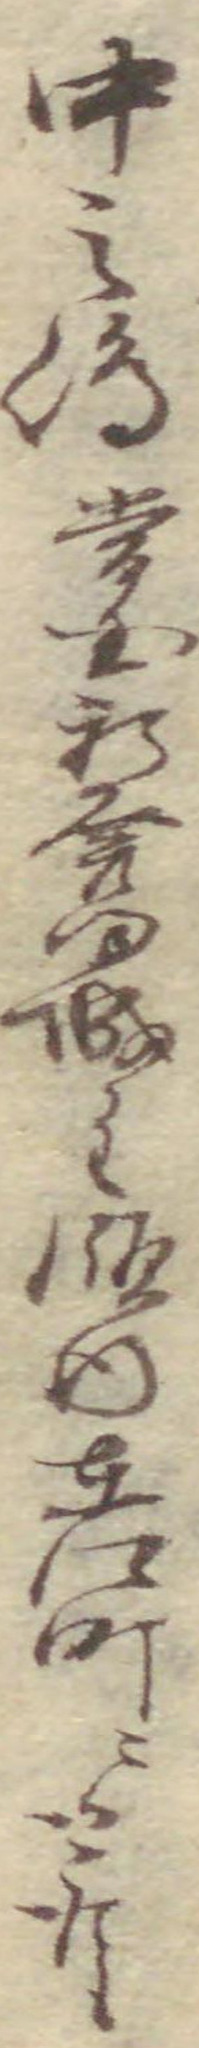中之島当国新発田城主領内在郷町ニ御座候
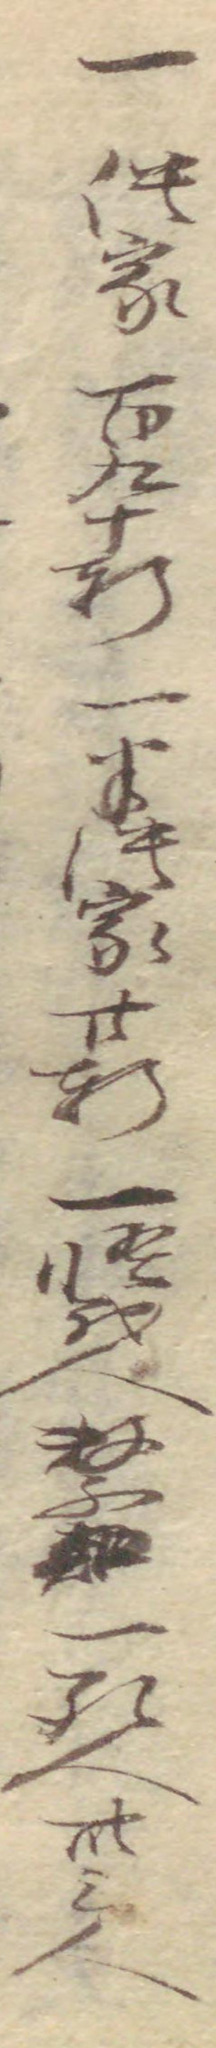一潰家百九十軒一半潰家廿軒一怪我人数千一死人卅三人
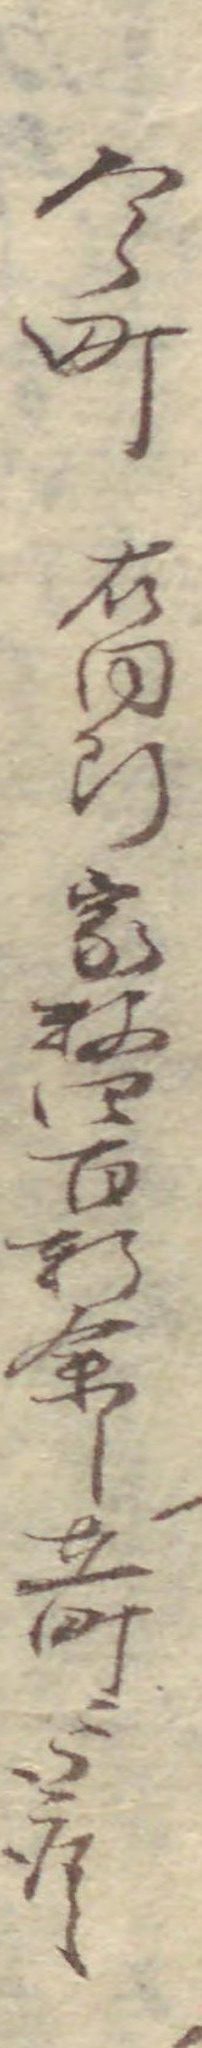今町右同断家数四百軒余之在町ニ御座候
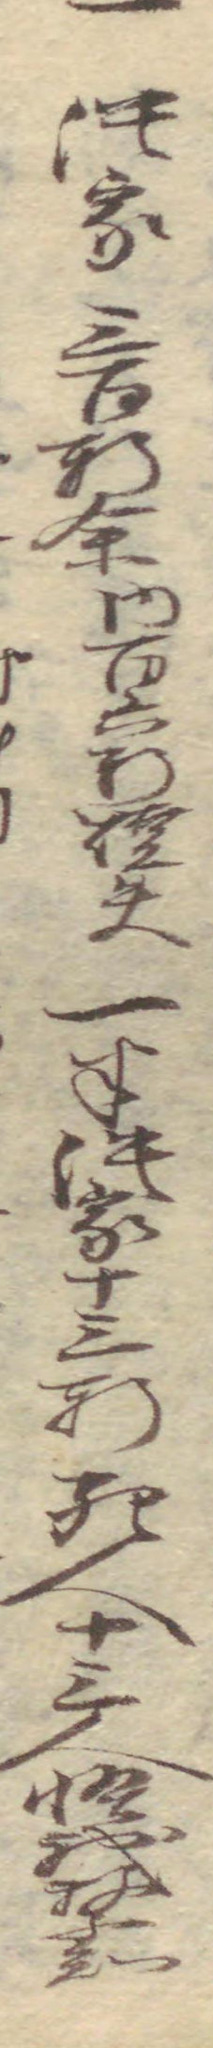一潰家三百軒余内百六間焼失一半潰家十三軒死人十三人怪我数不知
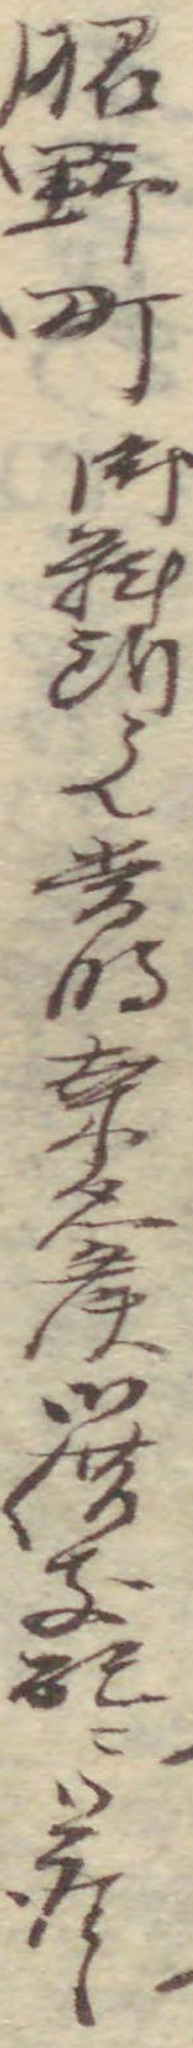脇野町御料所ニて当時桑名侯御借支配ニ御座候
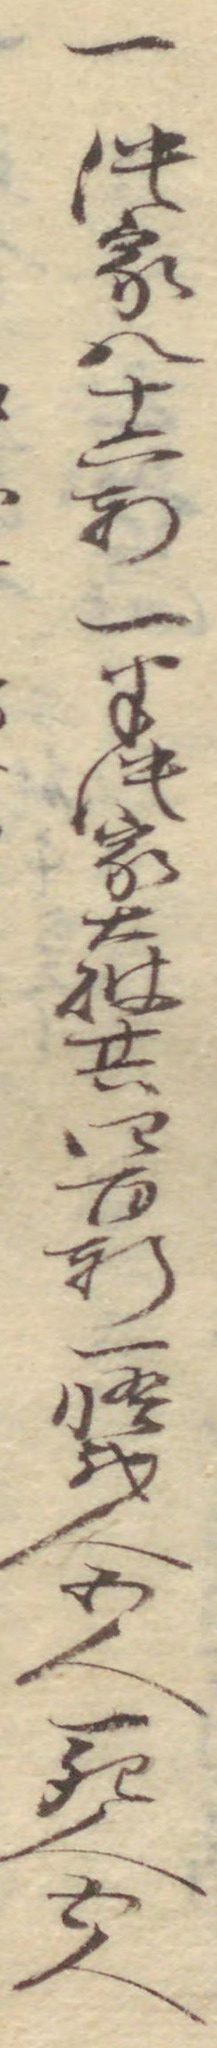一潰家八十六軒一半潰家大破共四百軒一怪我人五人一死人五人
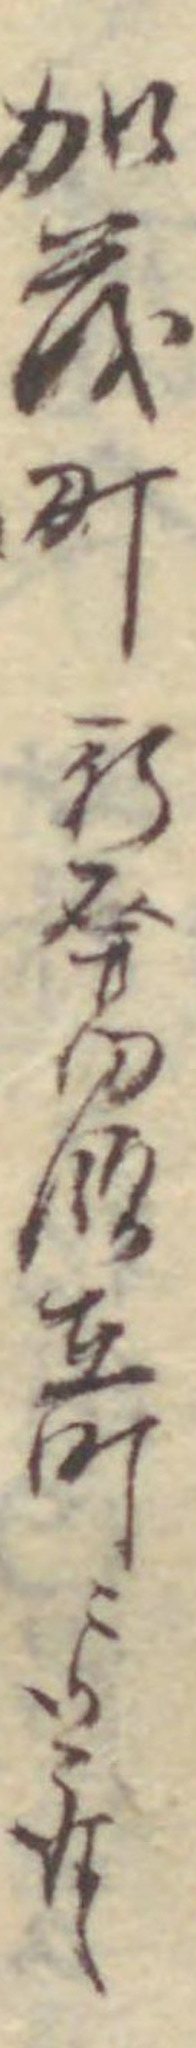加茂町新発田領在町ニ御座候
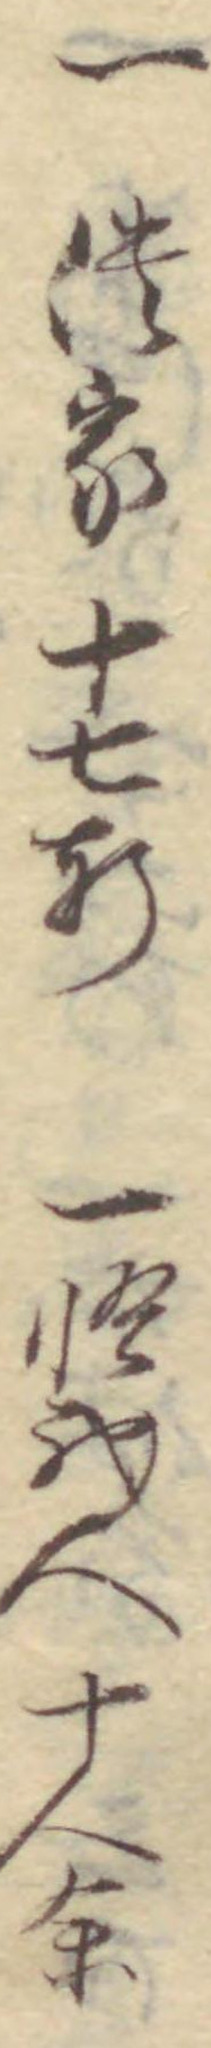一潰家十七軒一怪我人十人余
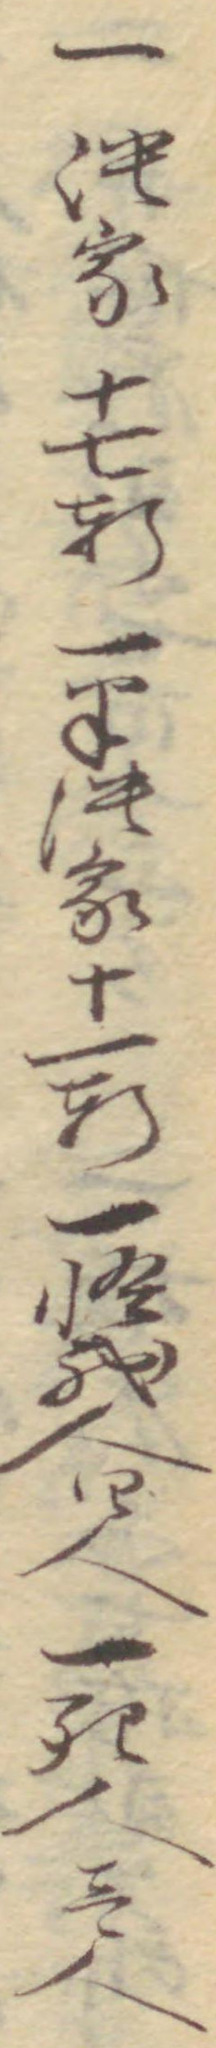一潰家十七軒一半潰家十一軒一怪我人四人一死人壱人
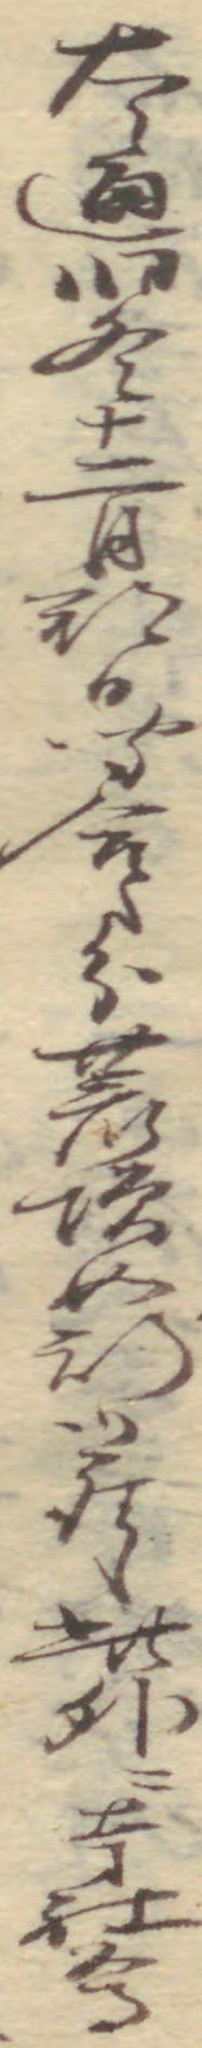右之通旧冬十二月朔日聞合候分著損如斯御座候此外ニ寺社等
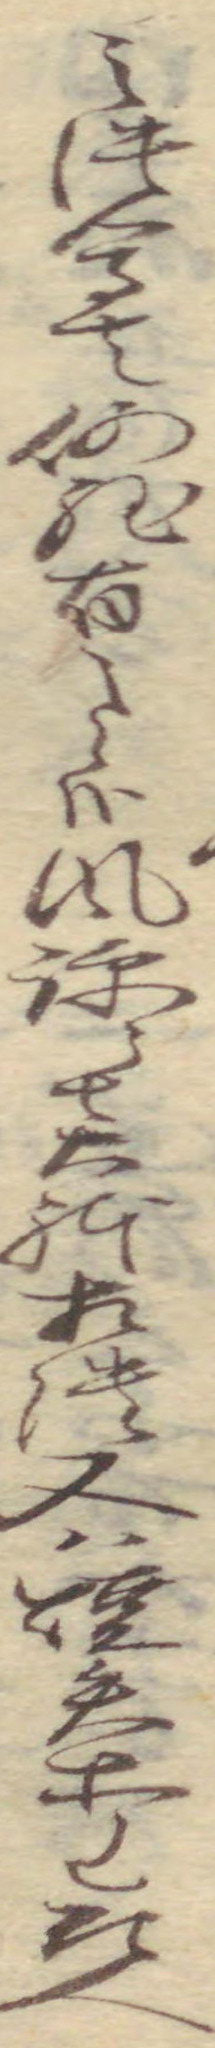之潰等も何程有之哉風便ニは右体相潰又ハ焼失等ニて死人
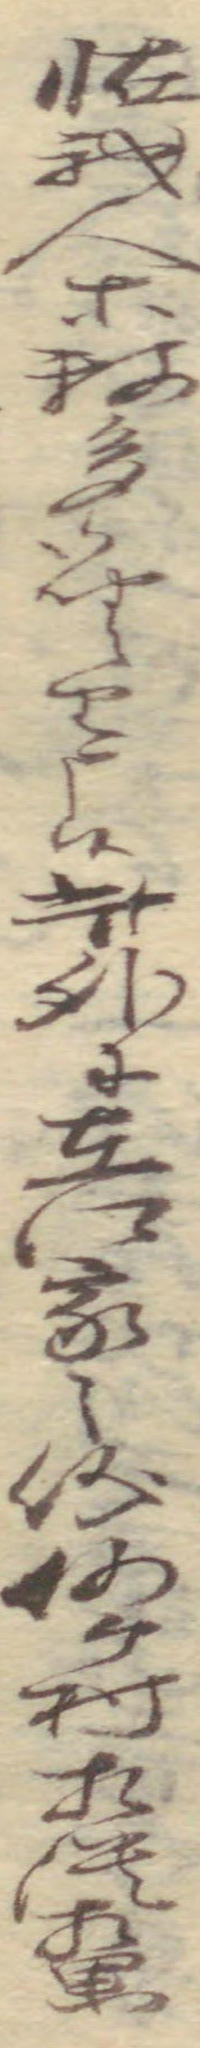怪我人等数多御座候由申候此外に在郷家之儀何ケ村相潰相果
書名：鶯宿雑記. 巻199-200
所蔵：国立国会図書館 National Diet Library, JAPAN
